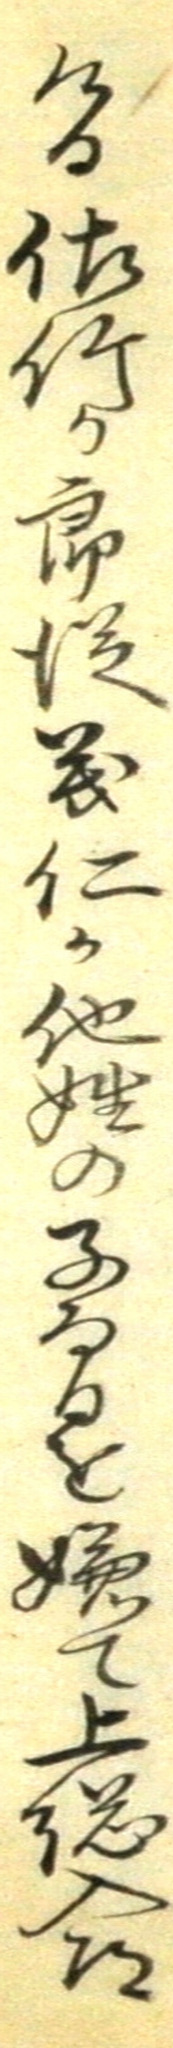ける佐竹か郎従義仁か他姓の子なるを嫌て上総入道
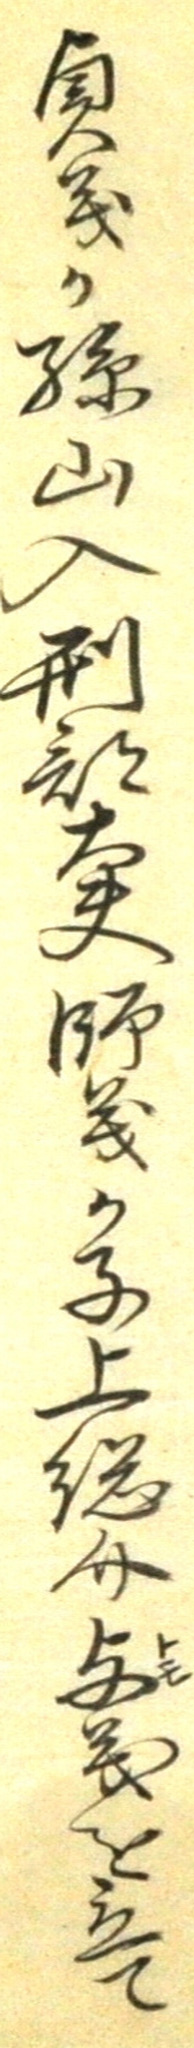貞義か孫山入刑部大夫師義か子上総介与義を立て
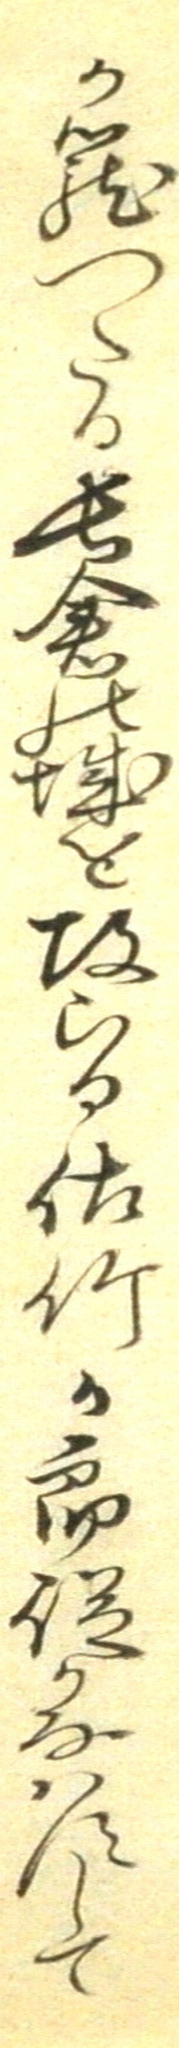か籠つたる長倉の城を攻らる佐竹か郎従かなはすして
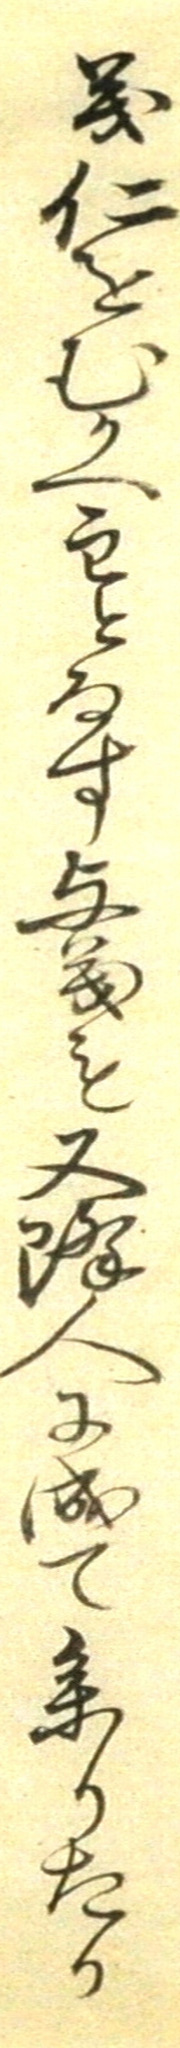義仁をむかへ主となす与義も又降人に成て参りたり
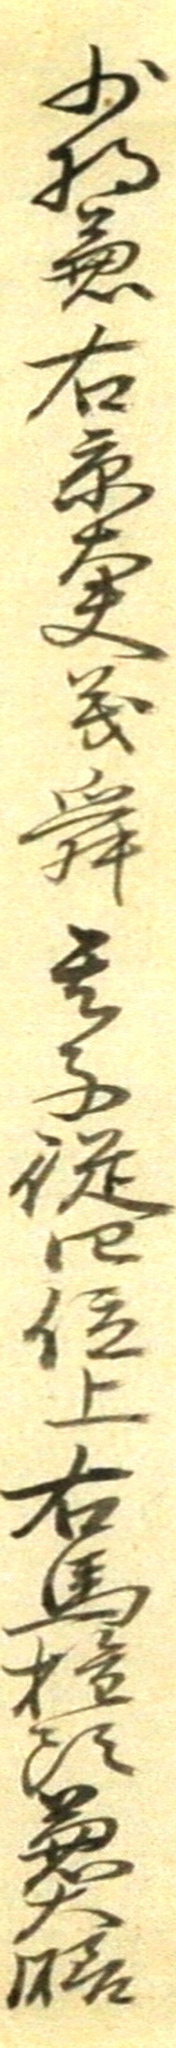少将兼右京大夫義舜其子従四位上右馬権頭兼大膳
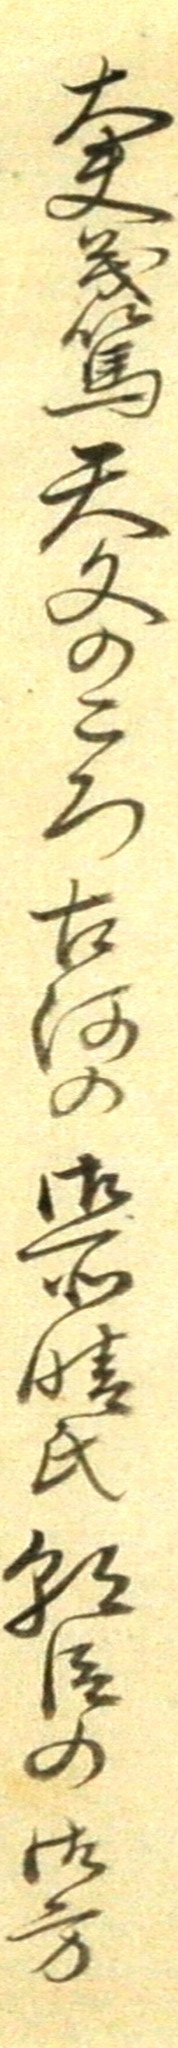大夫義篤天文のころ古河の御所晴氏朝臣の御方
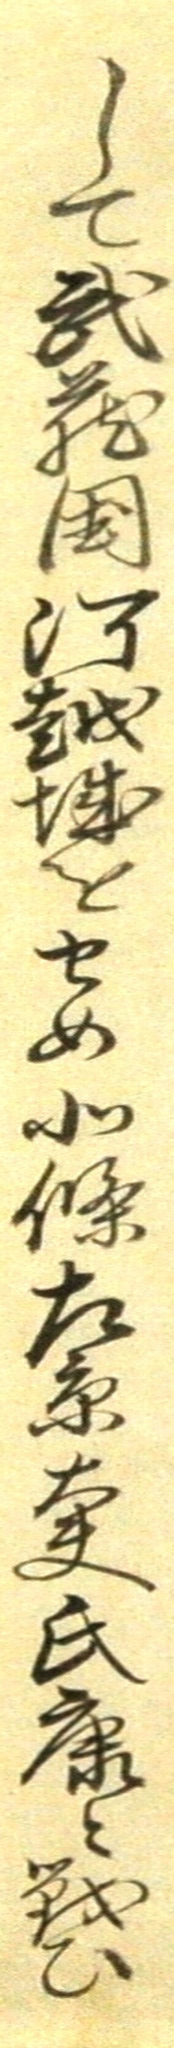して武蔵国河越城をせめ北条左京大夫氏康と戦ひ
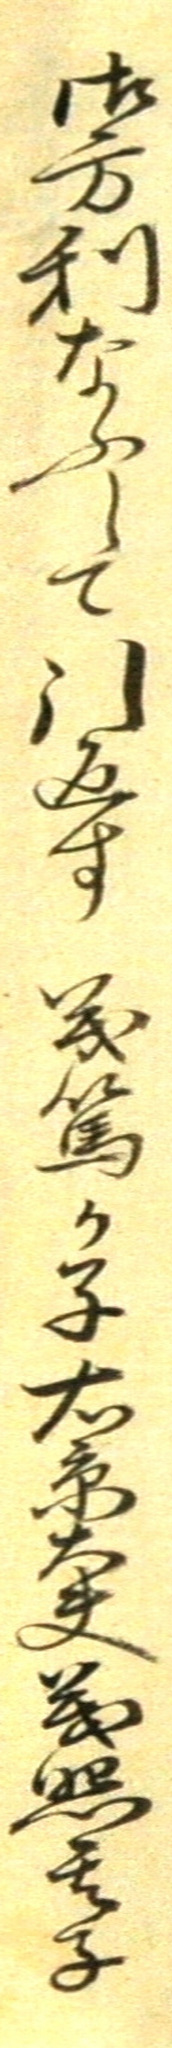御方利なふして引返す義篤か子右京大夫義照其子

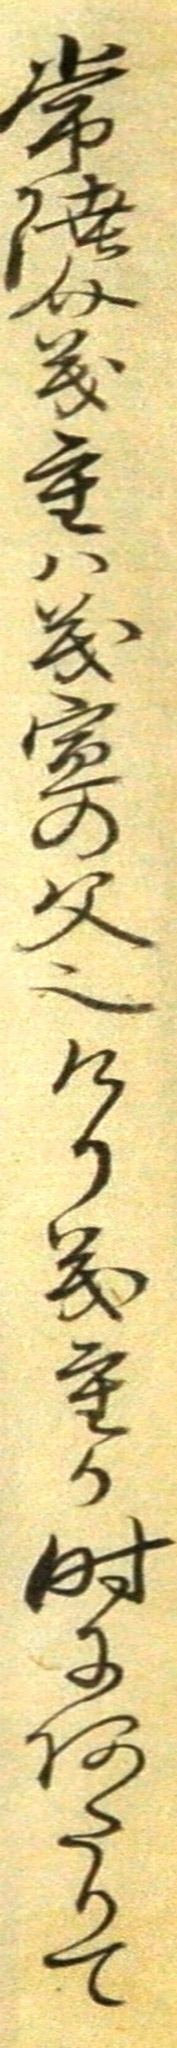常陸介義重は義宣の父也けり義重か時にあたりて
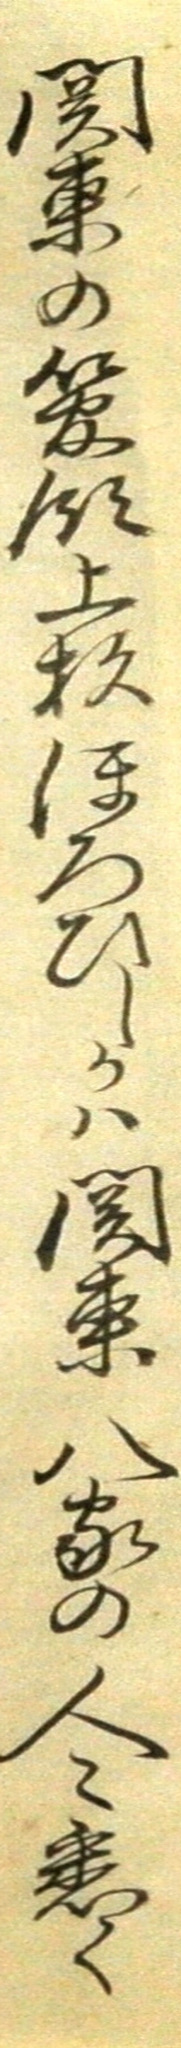関東の管領上杉ほろひしかは関東八家の人々悉く
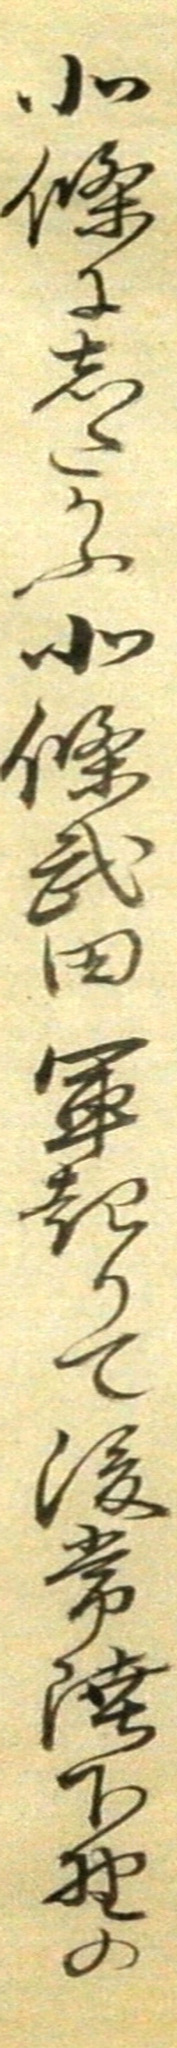北条にしたかふ北条武田軍起りて後常陸下野の
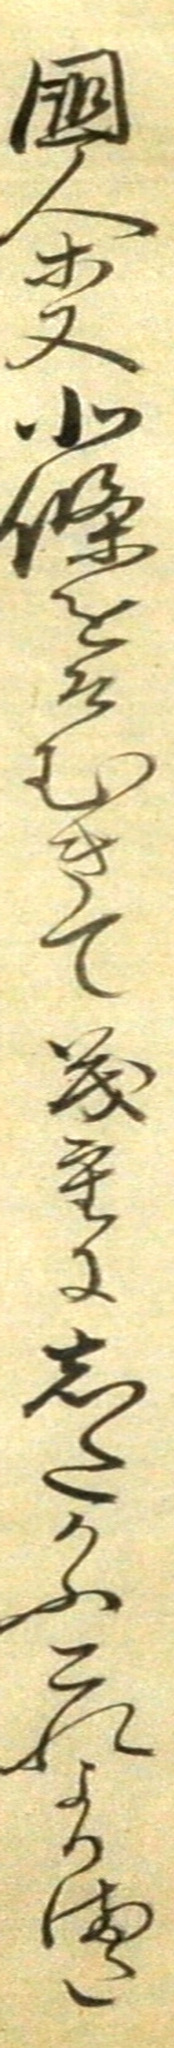国人等又北条をそむきて義重にしたかふこれよりまた
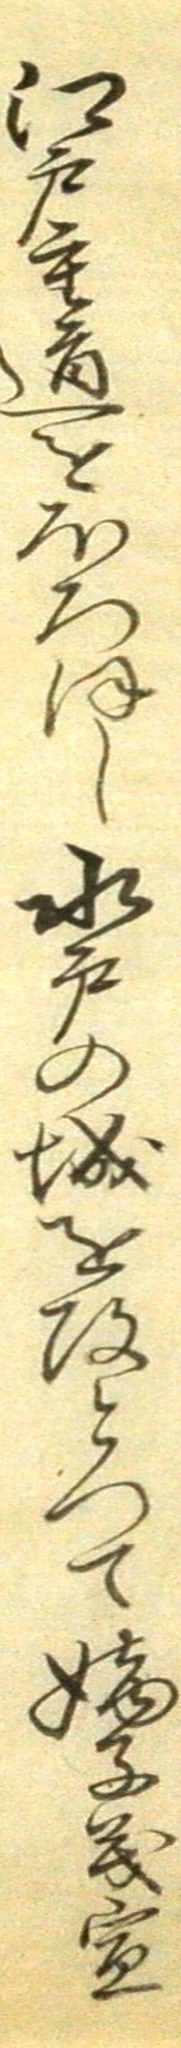江戸重道をほろほし水戸の城を攻とつて嫡子義宣
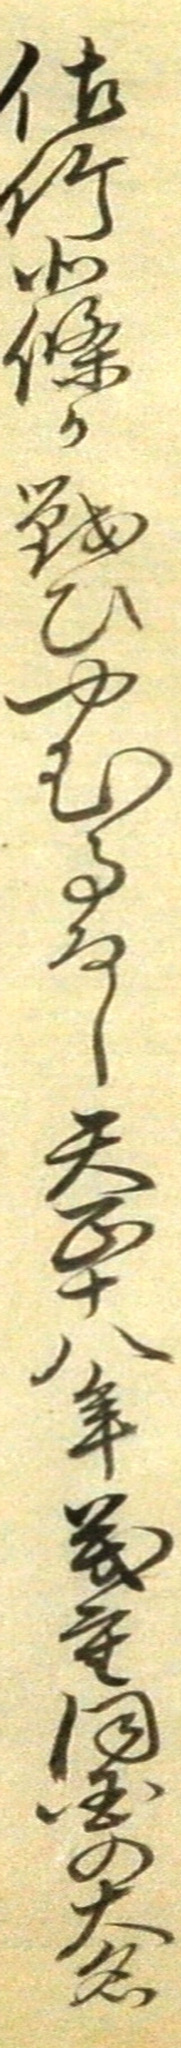佐竹北条か戦ひやむ事なし天正十八年義重同国の大名
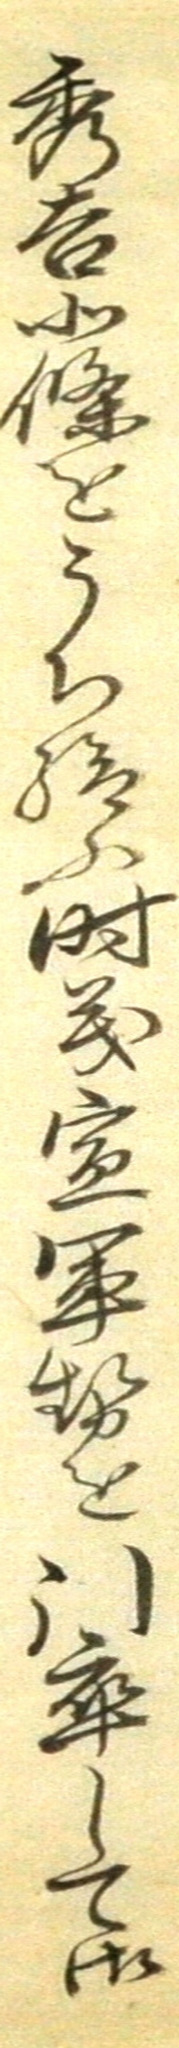秀吉北条をうち給ふ時義宣軍勢を引率して御
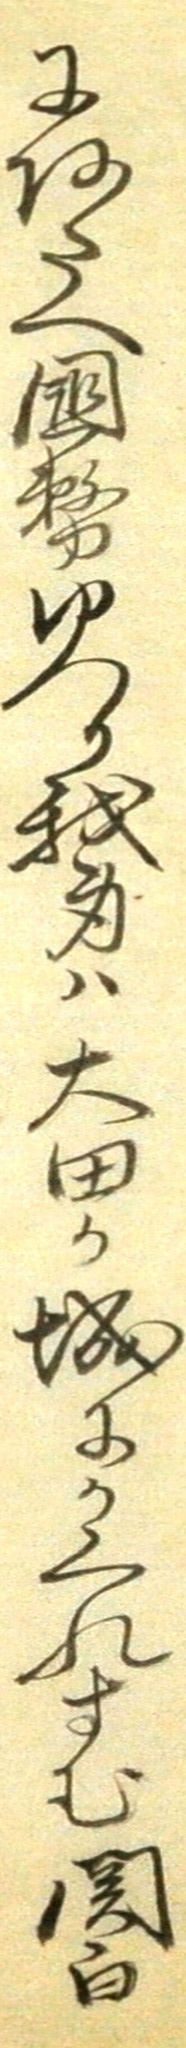にあたへ国勢ゆつり我身は大田か城にかくれすむ関白
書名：藩翰譜（八・下）
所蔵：伊那市立高遠町図書館・合同会社AMANE
